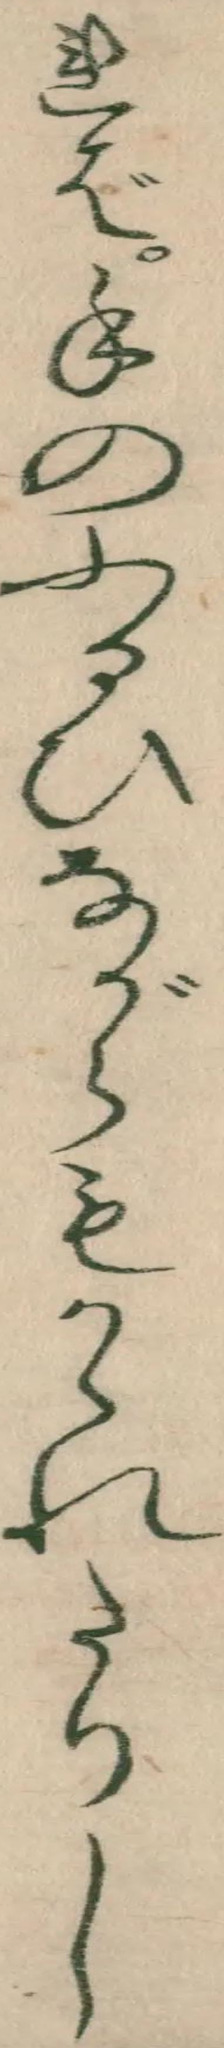れば。手のふるひながらもかゝれたりし
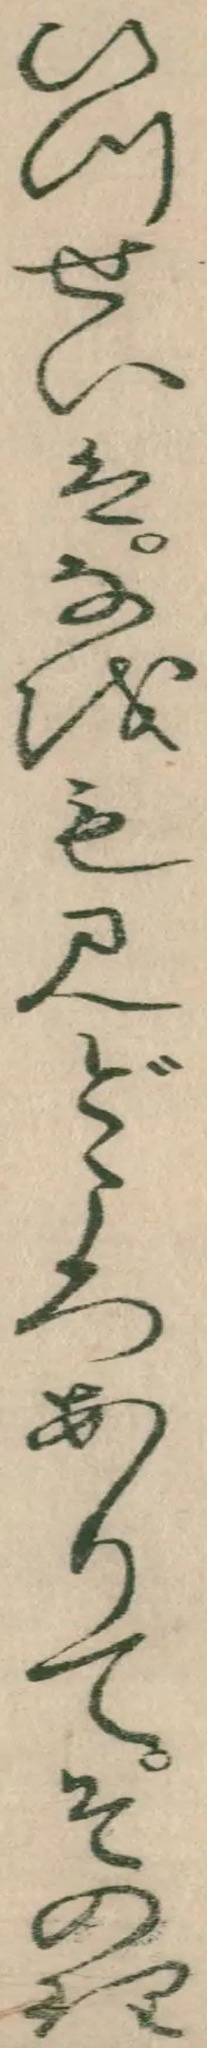ひつせいは。なをも見どころありて。その理
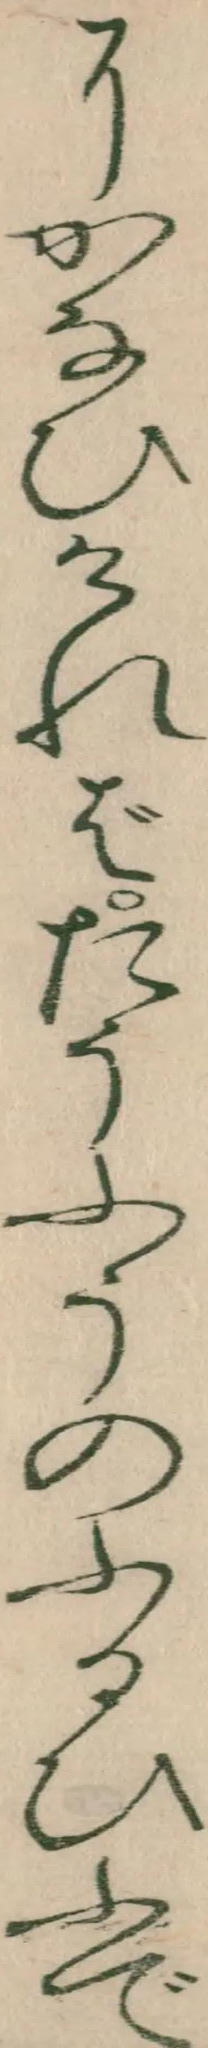にかなひければ。たうふうのふるひふで
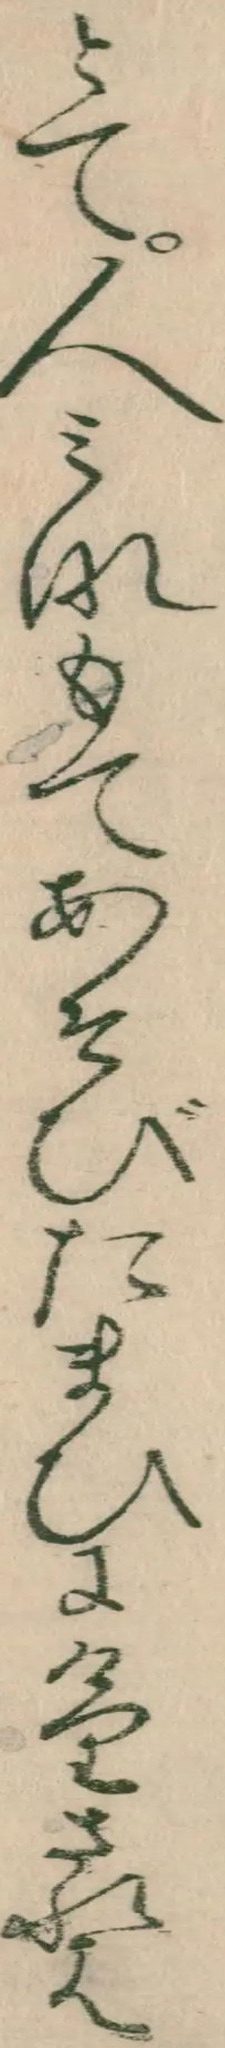とて。人みなもてあそびたまひにけりされは
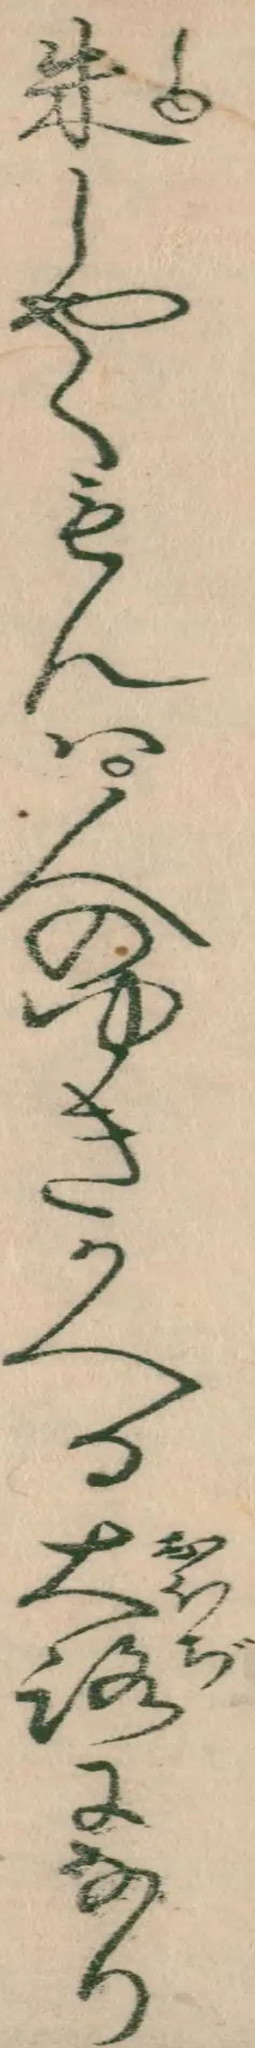朱しやくもんは。人のゆきかへる大路になり
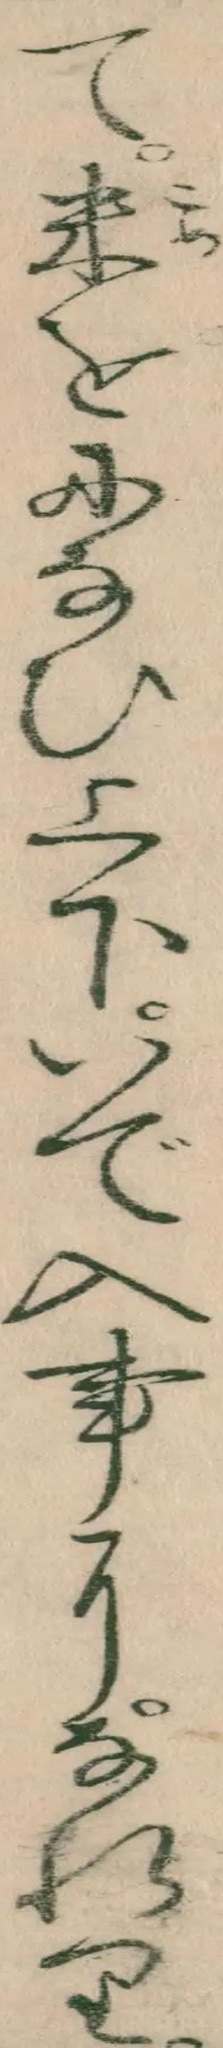て。米をになひ上下。いで入事に。なれり。
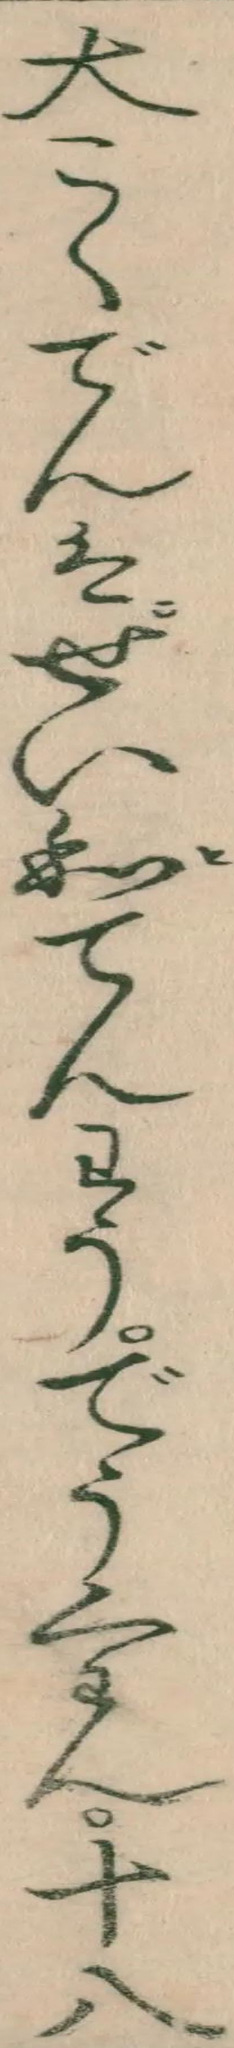大こくでんは。せい和てんわう。でうくわん。十八
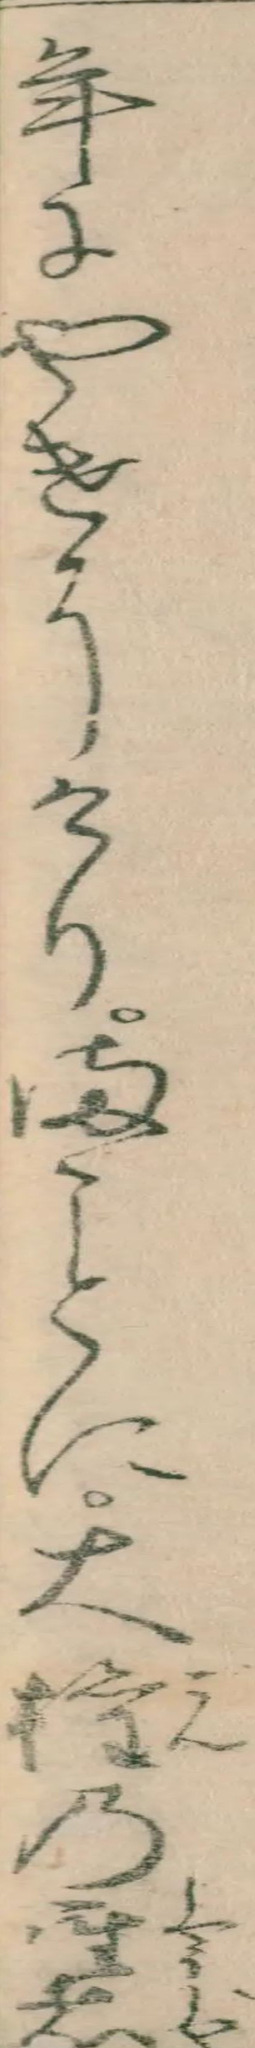年にやけにけり。まことに。大権の聖者
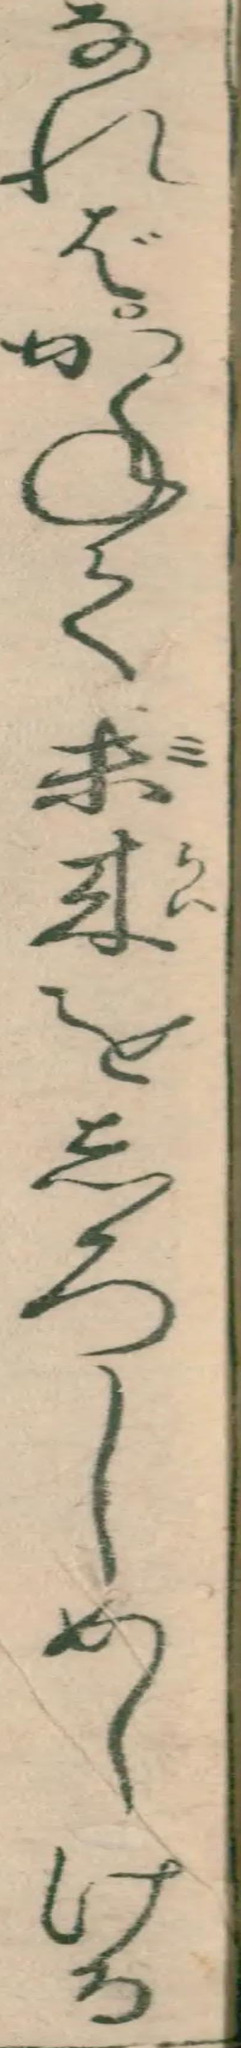なればかねて未来をしろしめしける
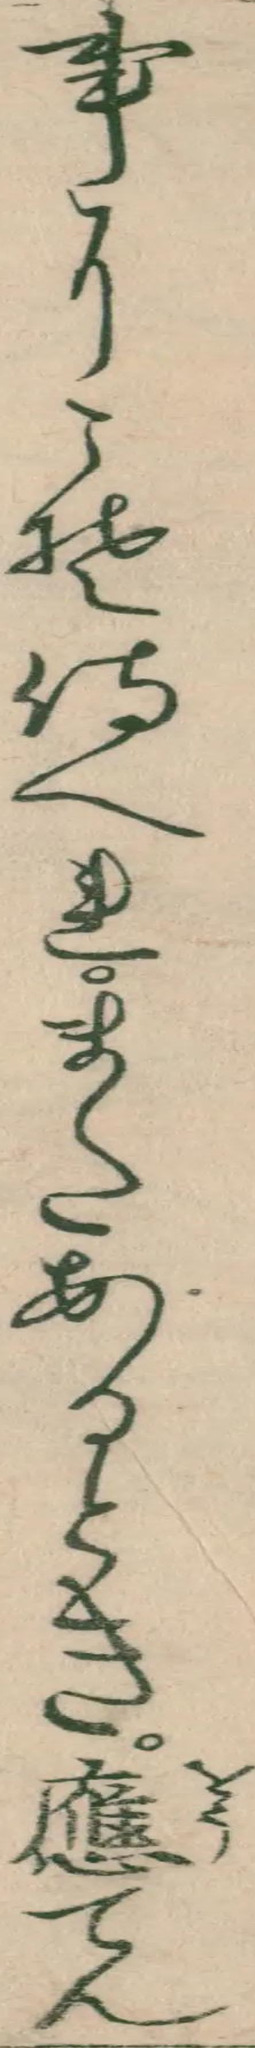事にこそ侍へれ。またあるとき応てん
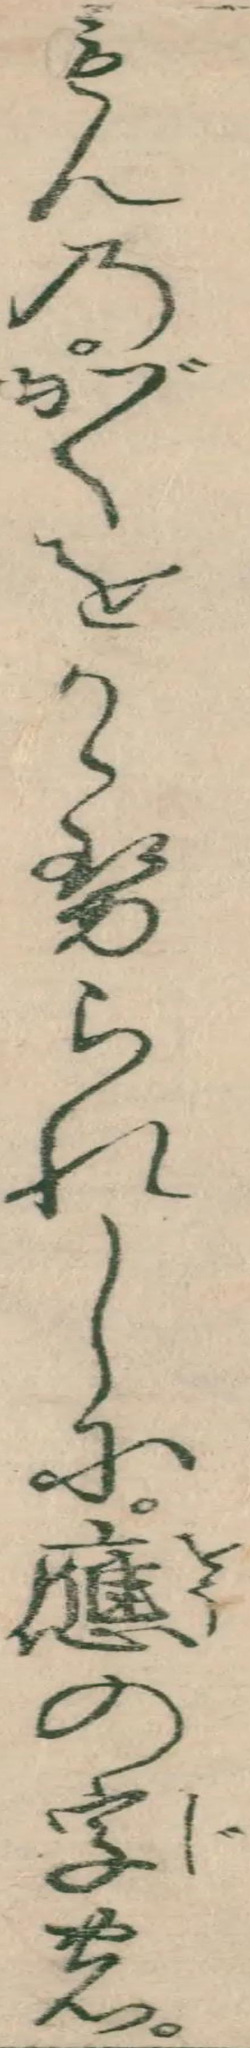もんの。がくをかゝせられしに応の字の。
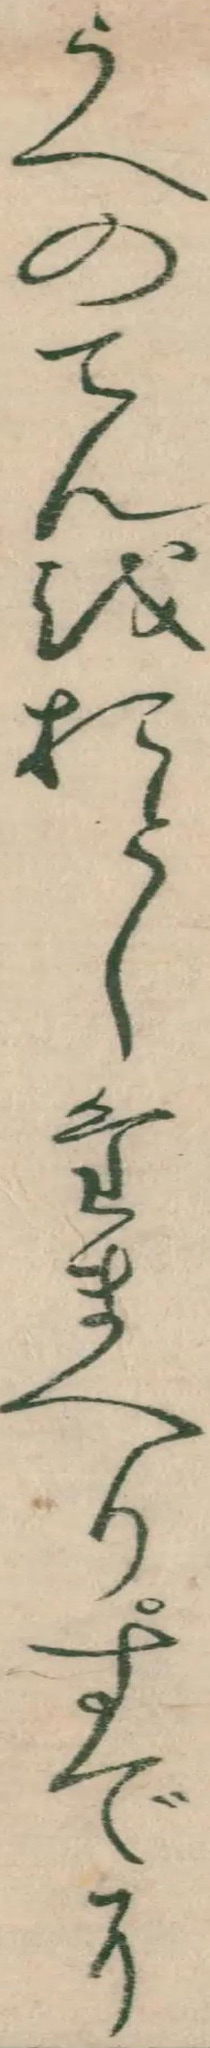うへのてんをおとしたまへり。すでに
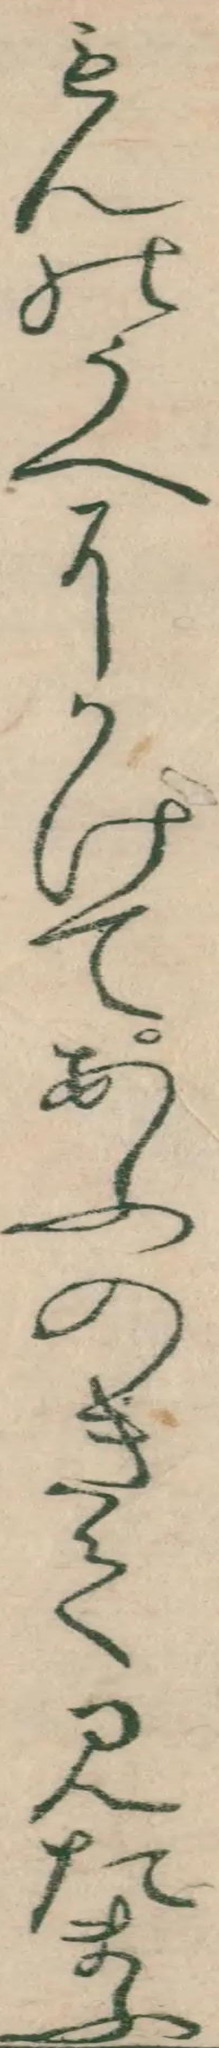もんのうへにかけて。あふのきて見たまふ
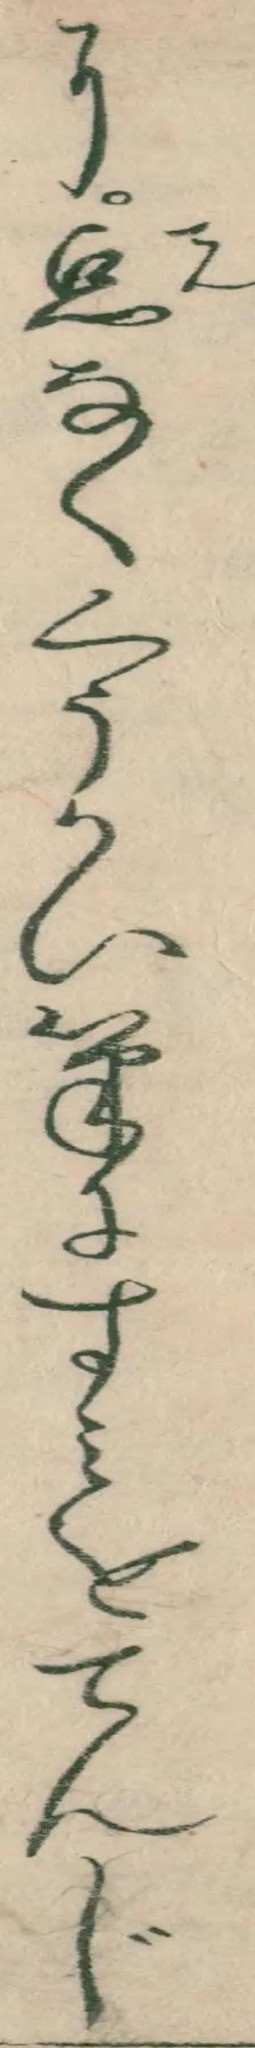に。点なくくうかい筆にすみをてんじ
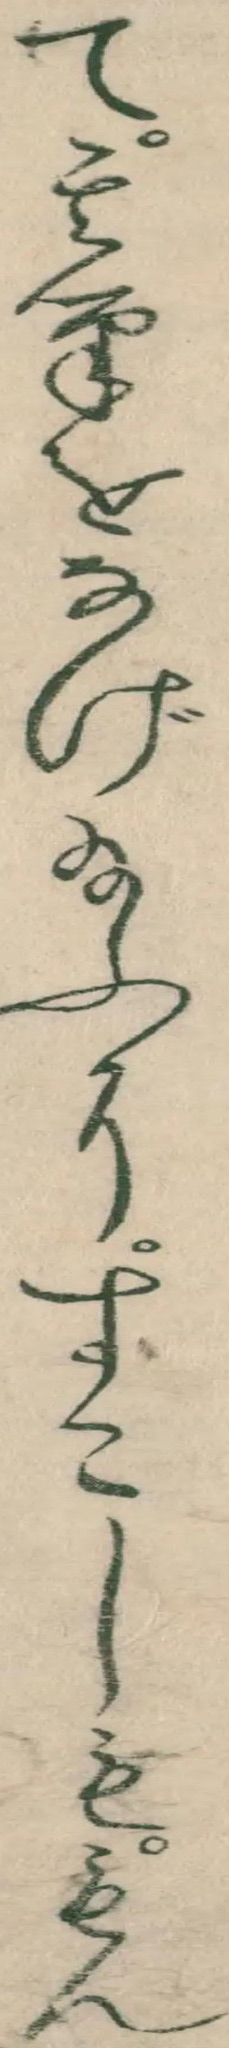て。其筆をなげ給ふに。すこしも。もん
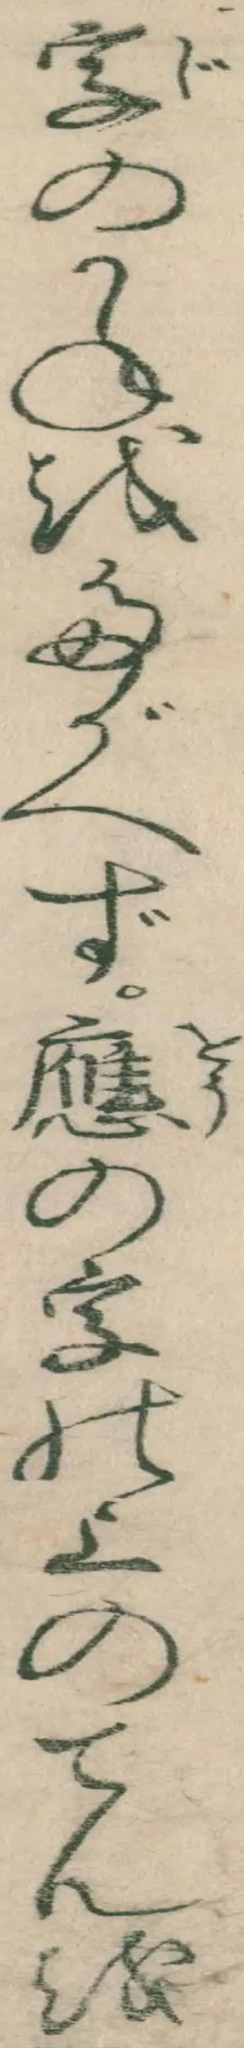字のかねをたがへず。応の字の上のてんを
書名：弘法大師御本地 3巻. [2]
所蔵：国立国会図書館 National Diet Library, JAPAN
